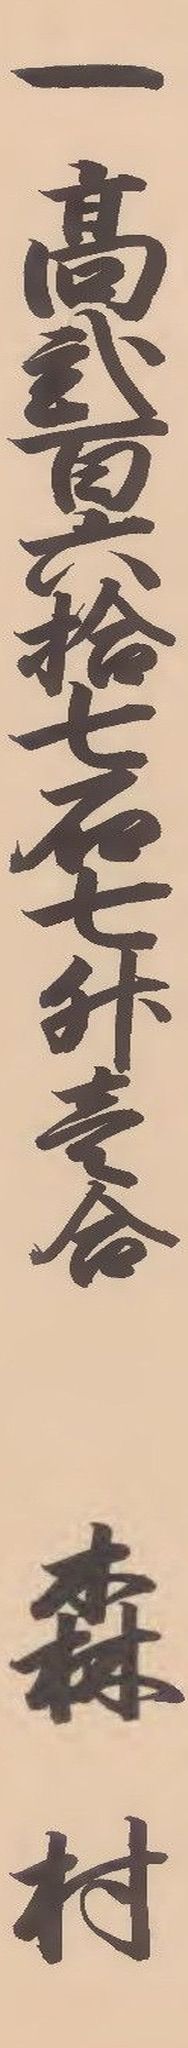一高弐百六拾七石七升壱合森村

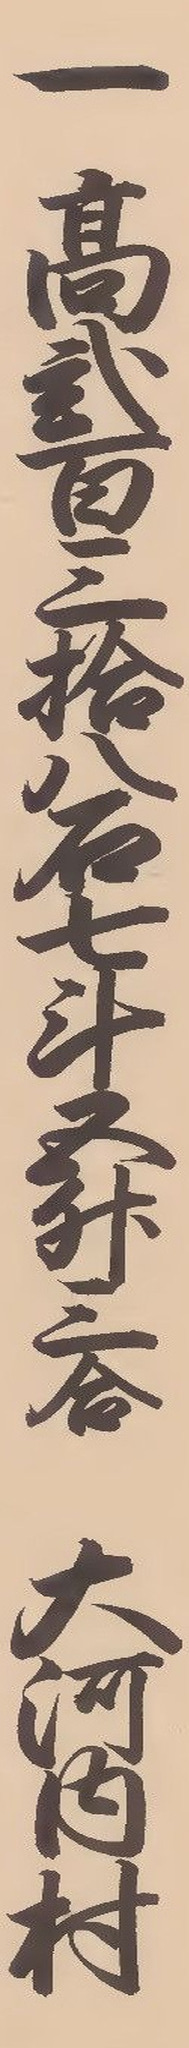一高弐百三拾八石七斗五升三合大河内村
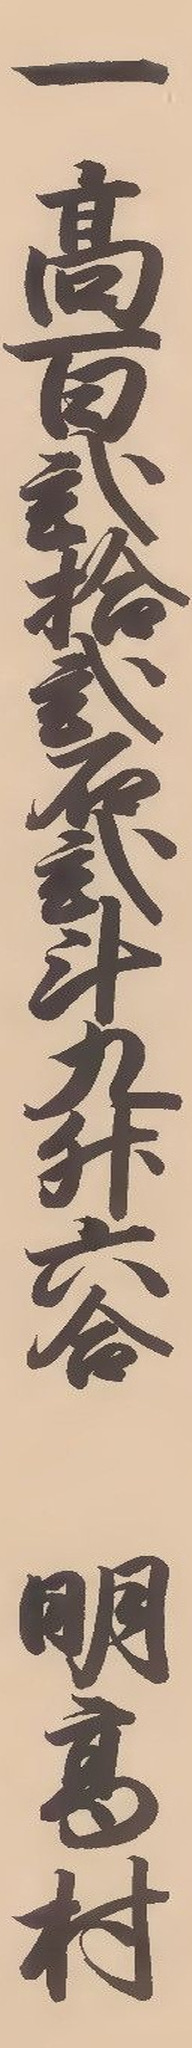一高百弐拾弐石弐斗九升六合明高村
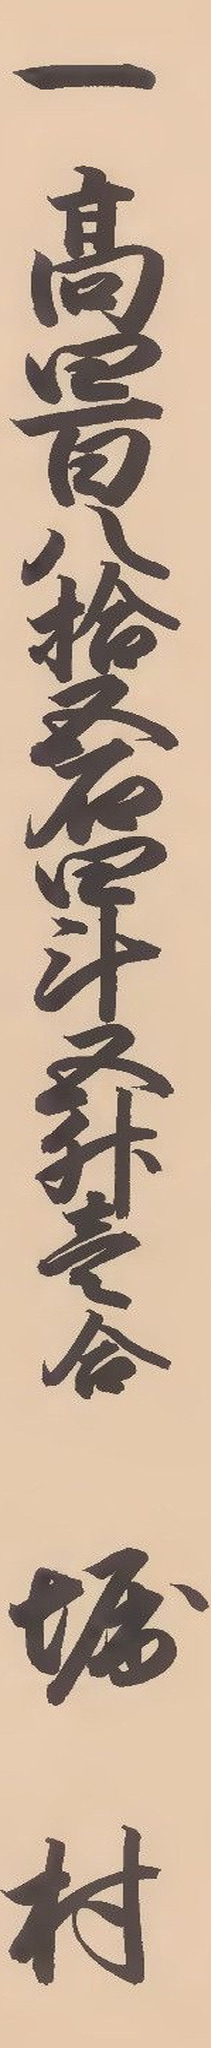一高四百八拾五石四斗五升壱合堀村
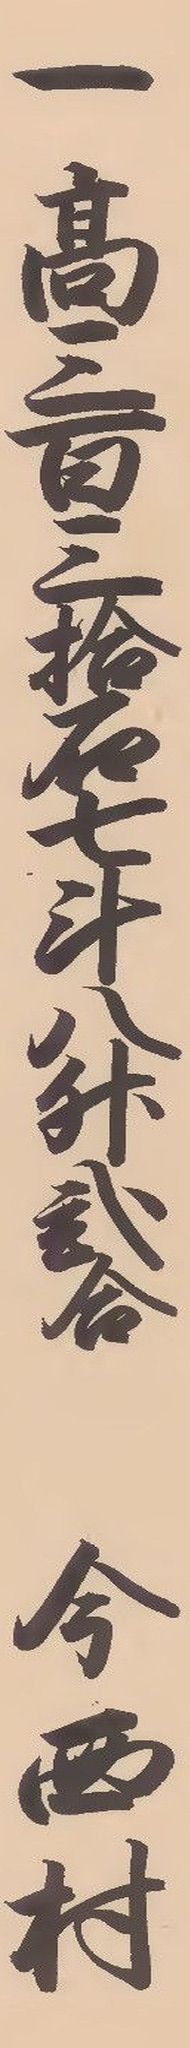一高三百三拾石七斗八升弐合今西村

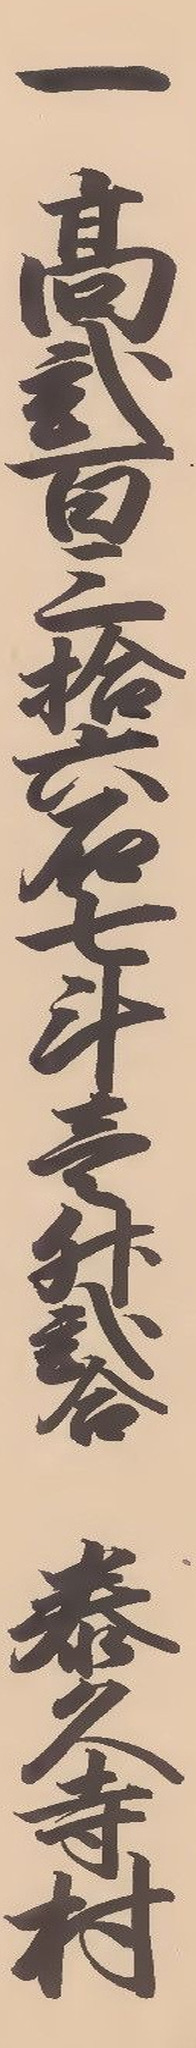一高弐百三拾六石七斗壱升弐合泰久寺村
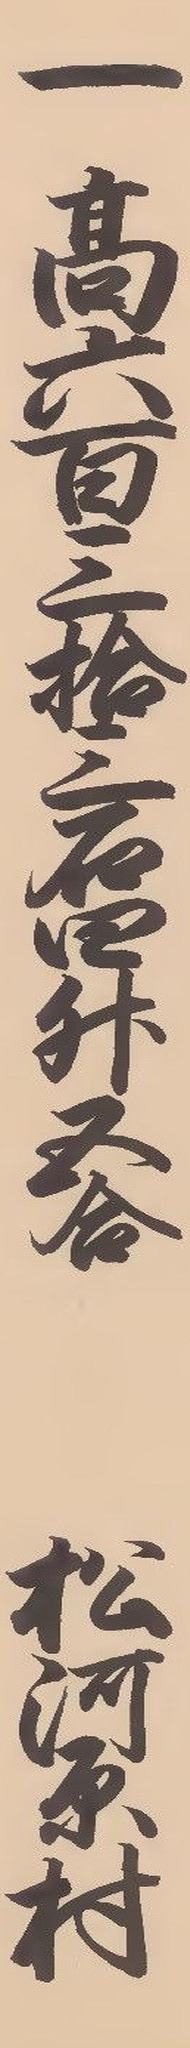一高六百三拾三石四升五合松河原村
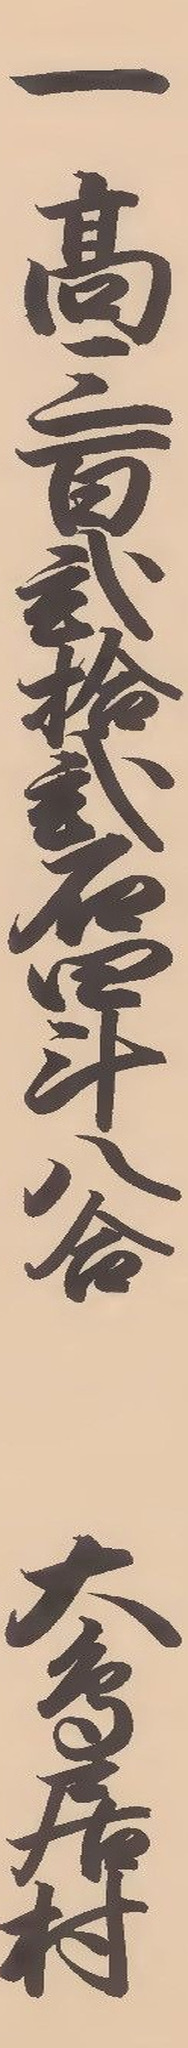一高三百弐拾弐石四斗八合大鳥居村
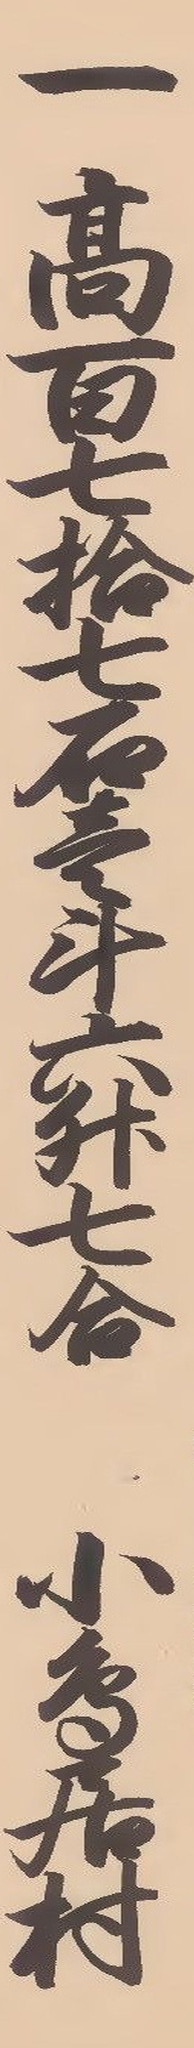一高百弐拾三石弐斗六升七合生竹村
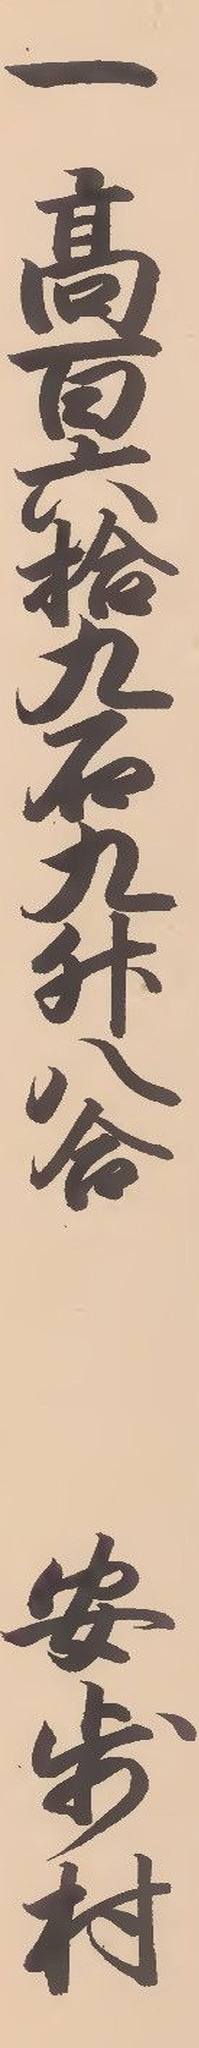一高百六拾九石九升八合安歩村
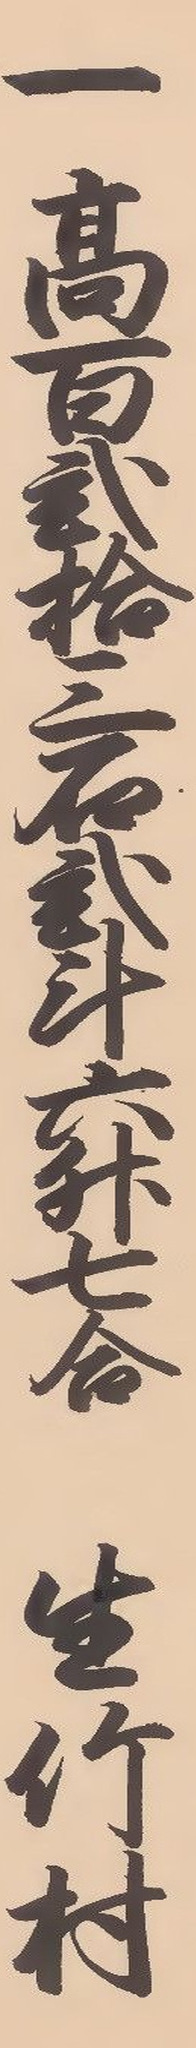一高百弐拾三石弐斗六升七合生竹村
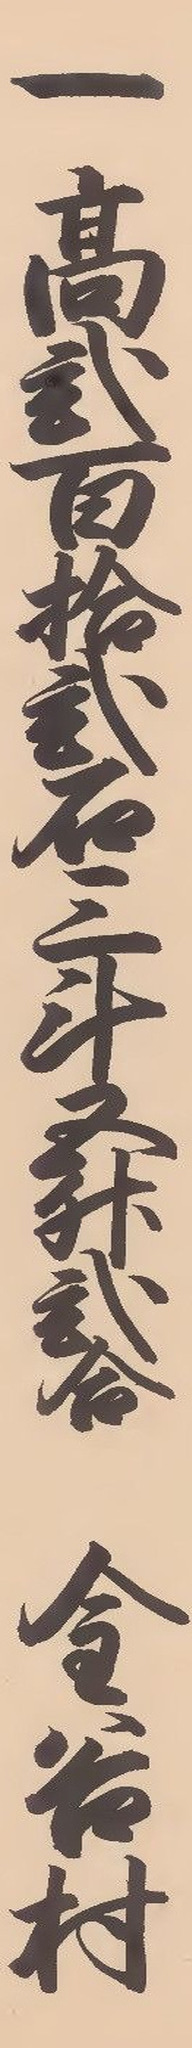一高弐百拾弐石三斗五升弐合金谷村
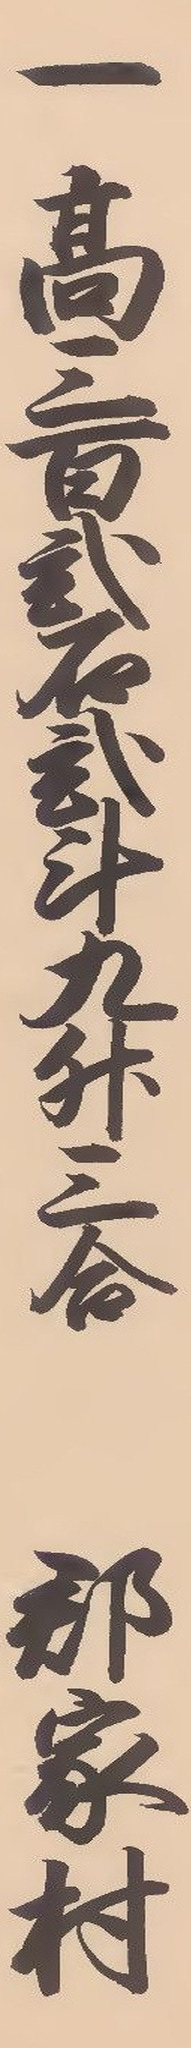一高三百弐石弐斗九升三合郡家村

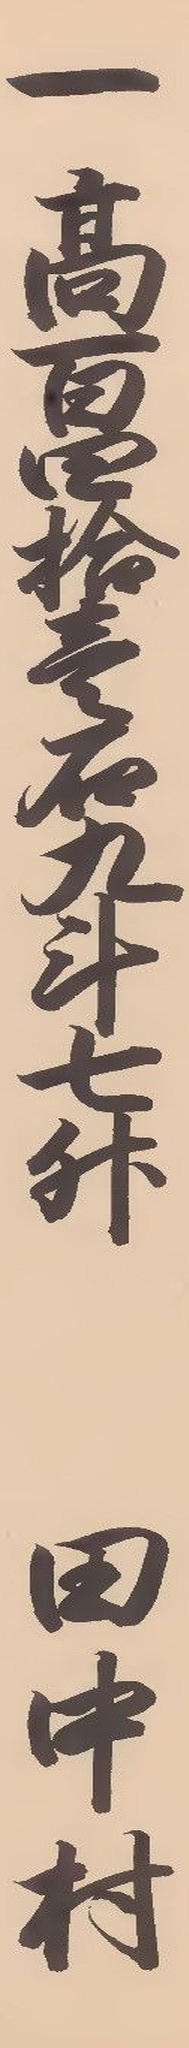一高百四拾壱石九斗七升田中村
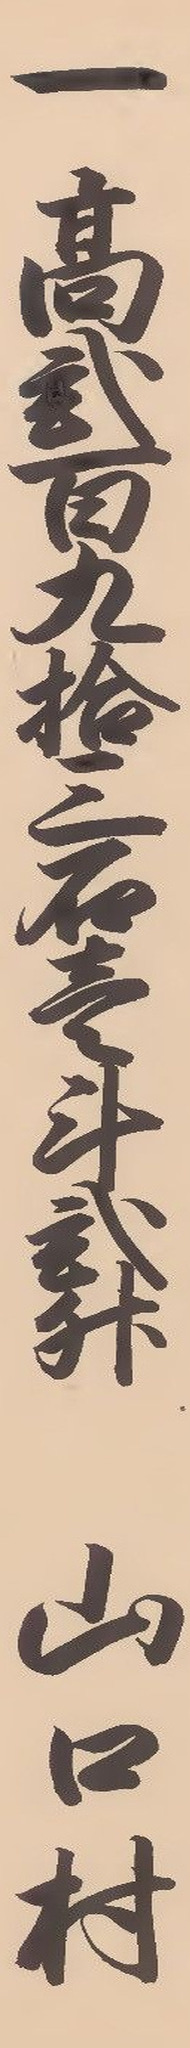一高弐百九拾三石壱斗弐升山口村
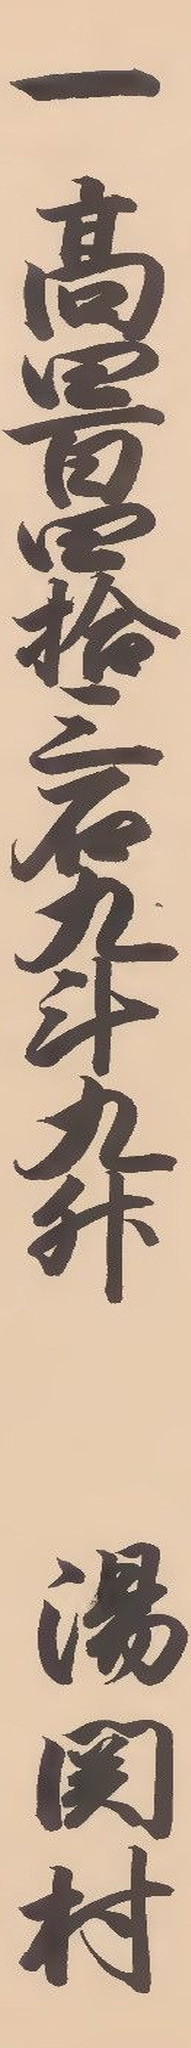一高四百四拾三石九斗九升湯関村
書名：伯耆国郷帳
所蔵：国立公文書館 National Archives of Japan
